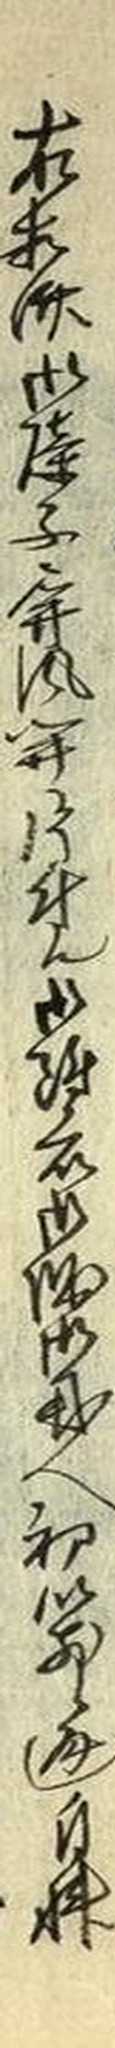右相済御障子屏風開片付ル御附衆御側御用人初以前之通自拝
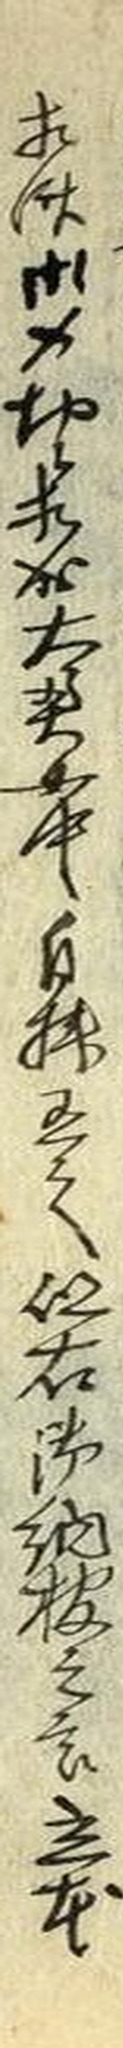相済御〆切ニ相成大奥女中自拝有之但右御納棺之節立本
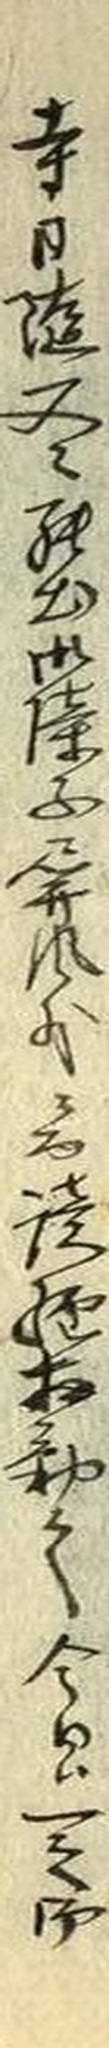寺日随又々罷出御障子屏風外ニ而読経相勤之今日ハ一之御
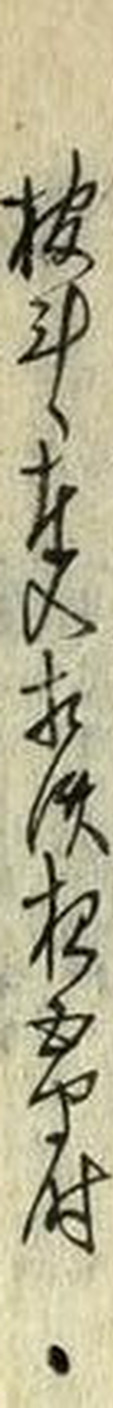棺斗へ奉入相済夜五半時
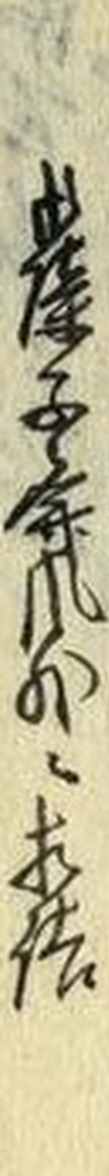御障子屏風外ニ相詰
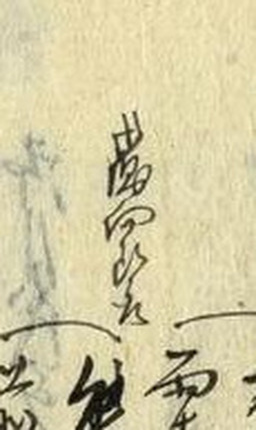御小姓頭取
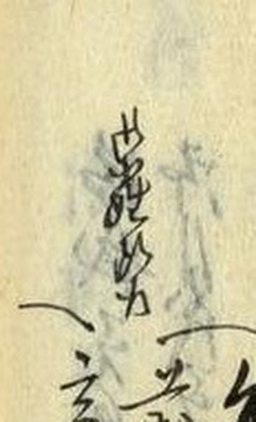御小姓頭取
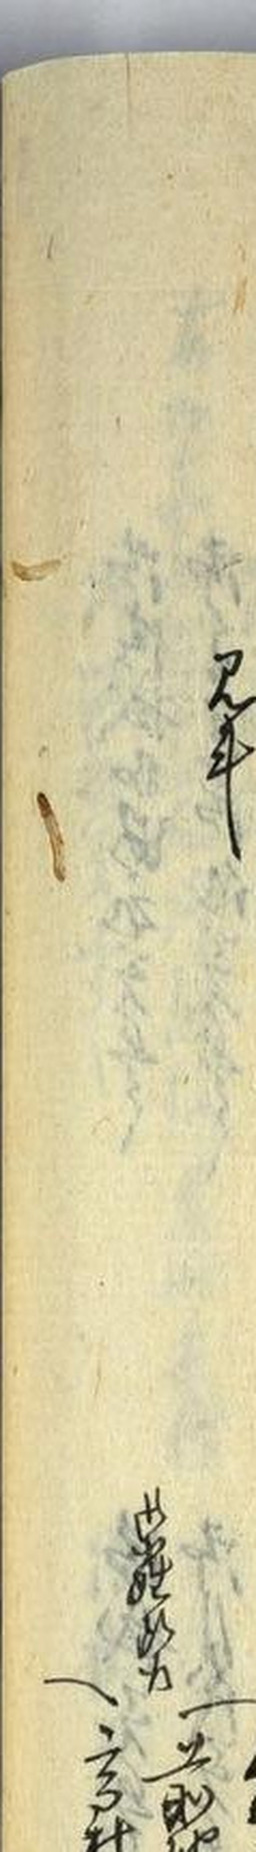御小姓頭取
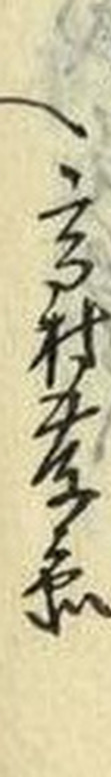高村藤兵衛
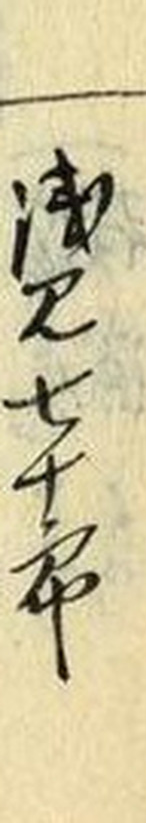浅見七十郎
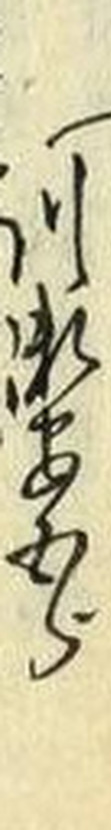川瀬安五郎
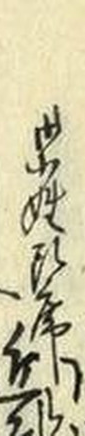御小姓頭取
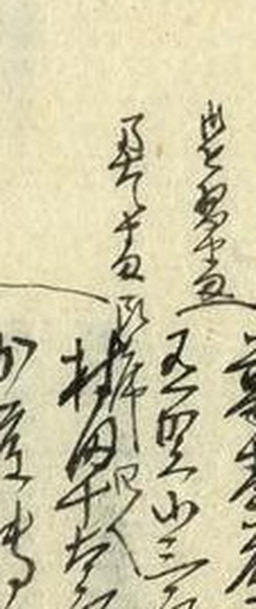奥之番頭席四人
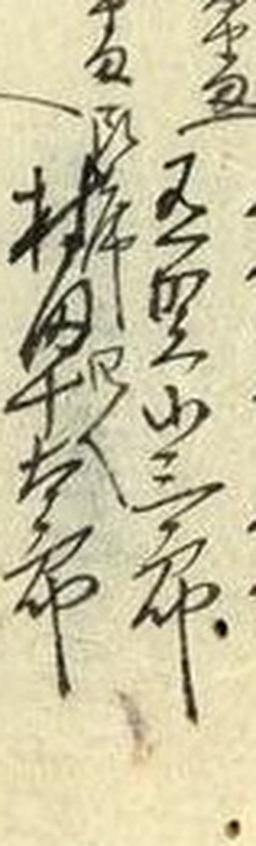村田十太郎
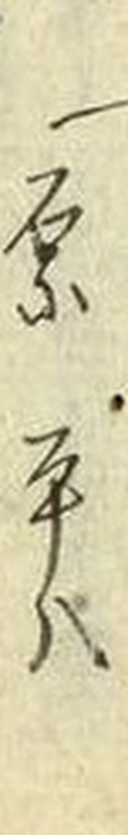原平八
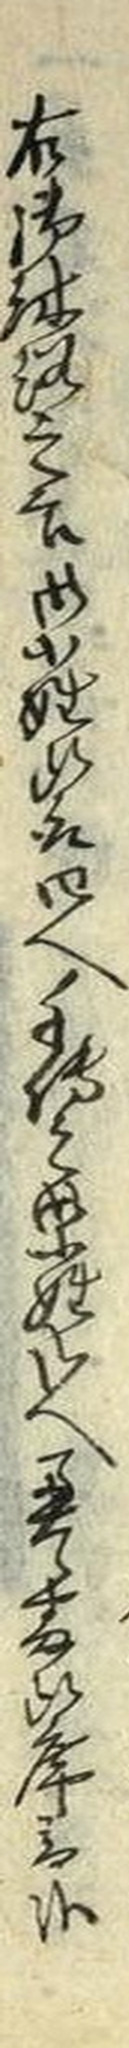右御沐浴之節御小姓頭取四人手伝之御小姓弐人奥之番頭席ニ而弐
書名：少傅日録抄（斉善付側向頭取日記、江戸并道中、初入在国、逝去後…
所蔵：福井県文書館 Fukui Prefectural Archives
